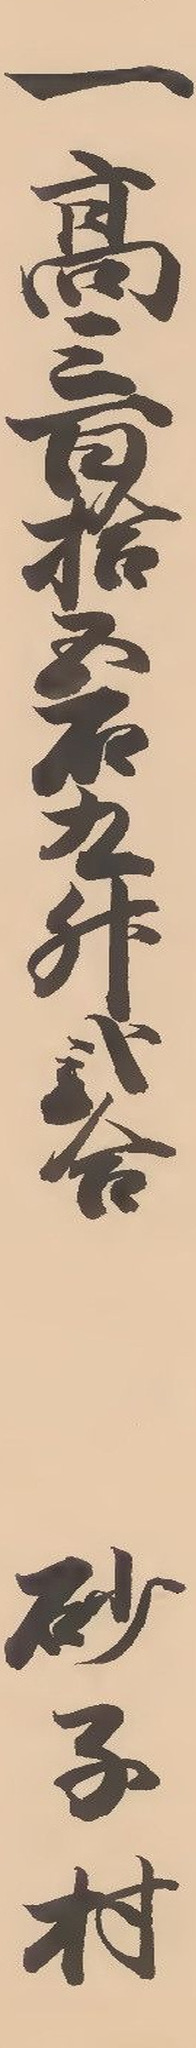一高三百拾五石九升弐合砂子村
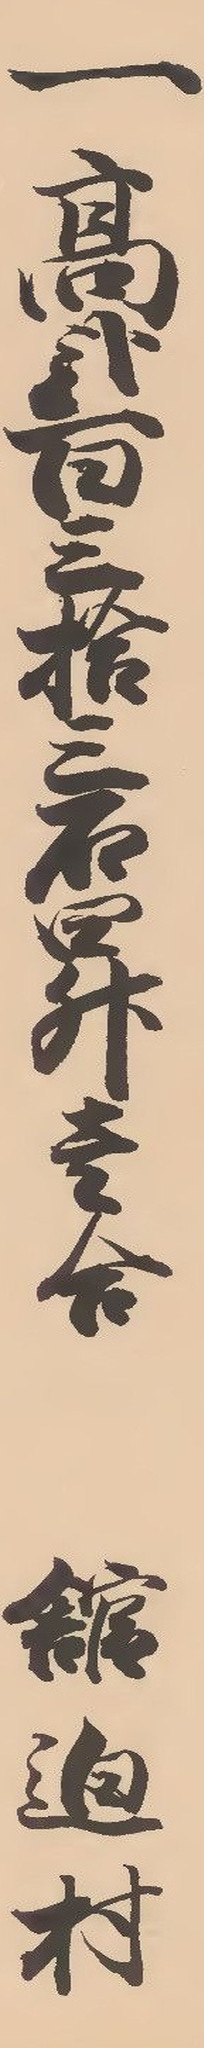一高弐百三拾三石四升壱合舘迫村
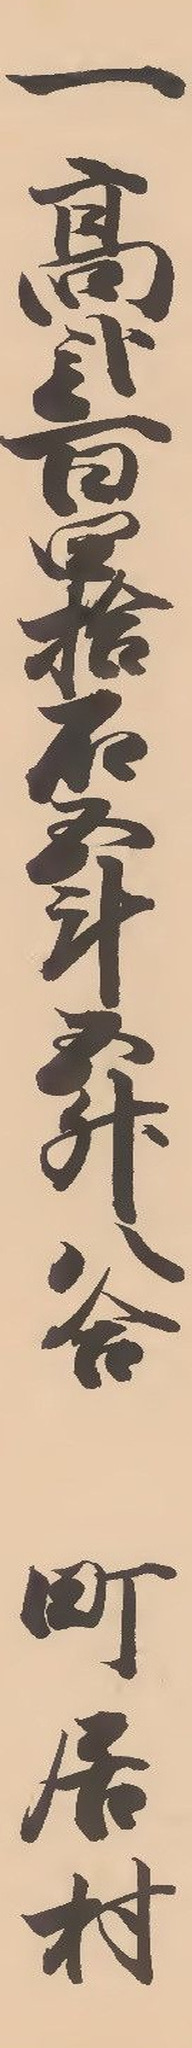一高弐百四拾石五斗五升八合町居村

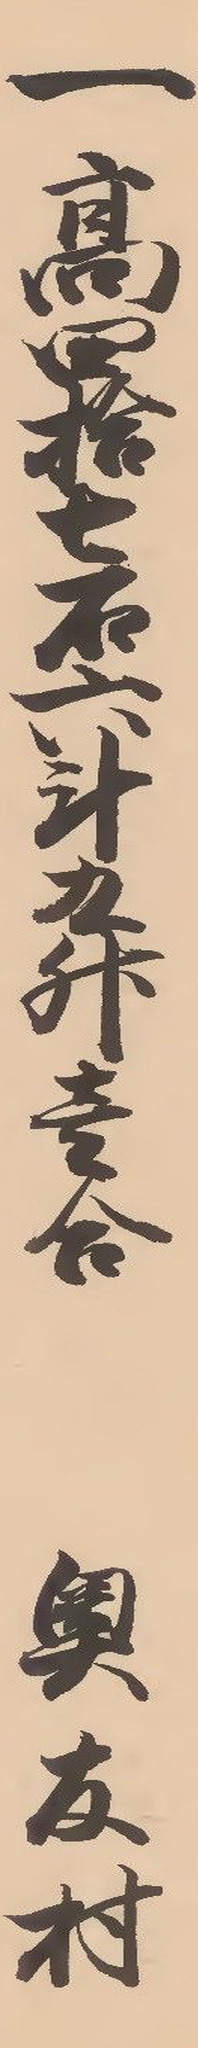一高四拾七石六斗九升壱合奥友村
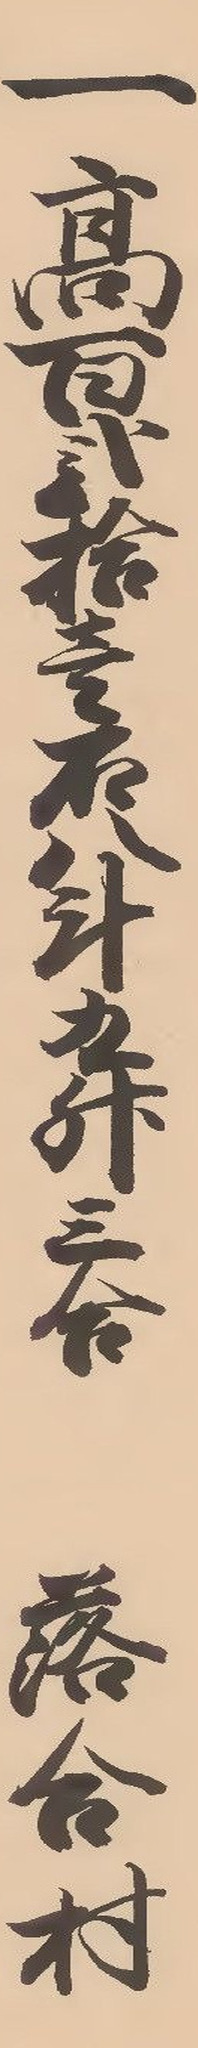一高百弐拾壱石八斗九升三合落合村
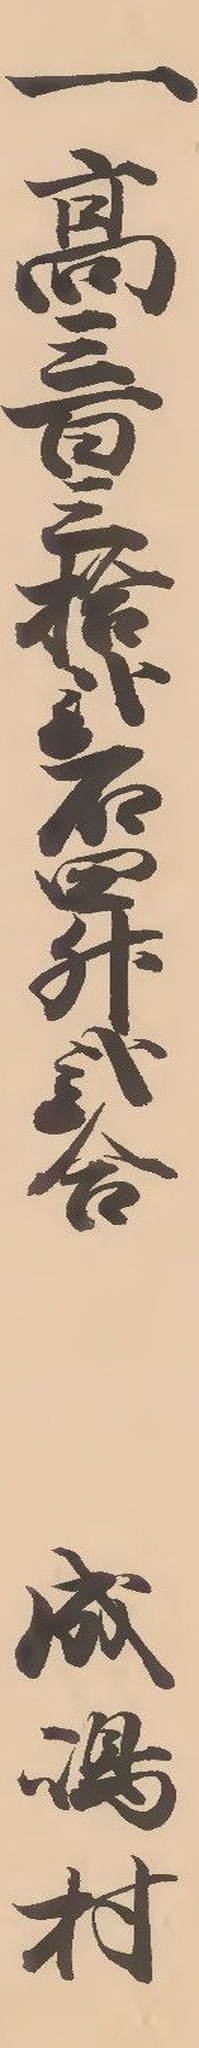一高三百三拾弐石四升弐合成島村
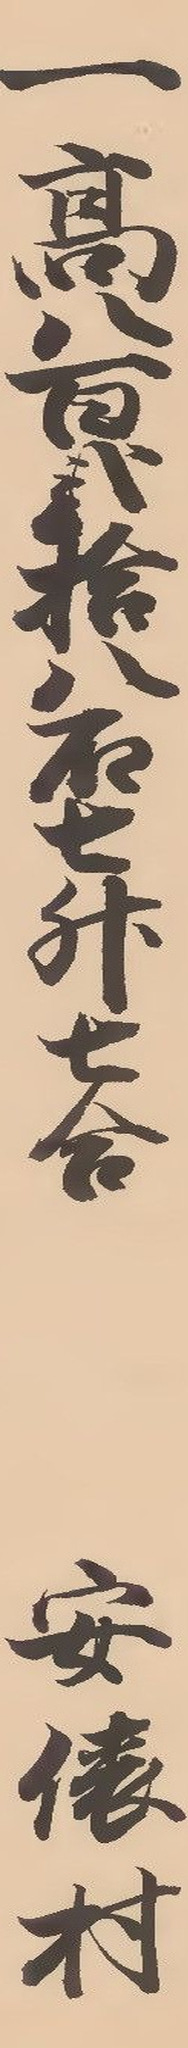一高八百弐拾八石七升七合安俵村
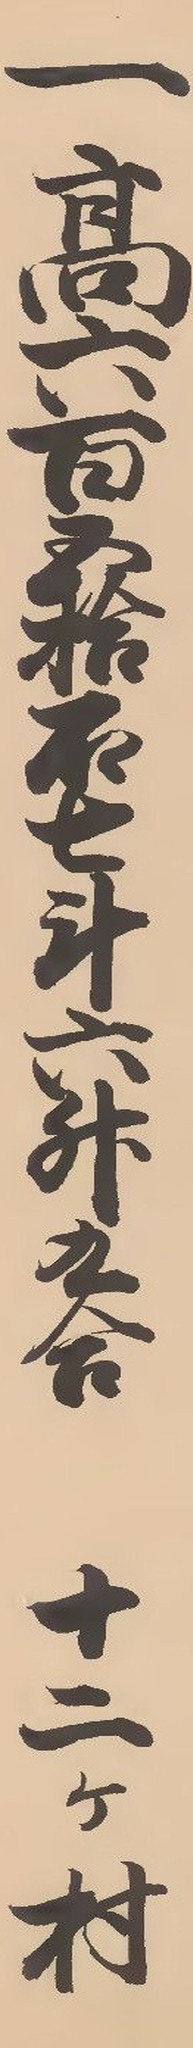一高六百五拾石七斗六升九合十二ヶ村
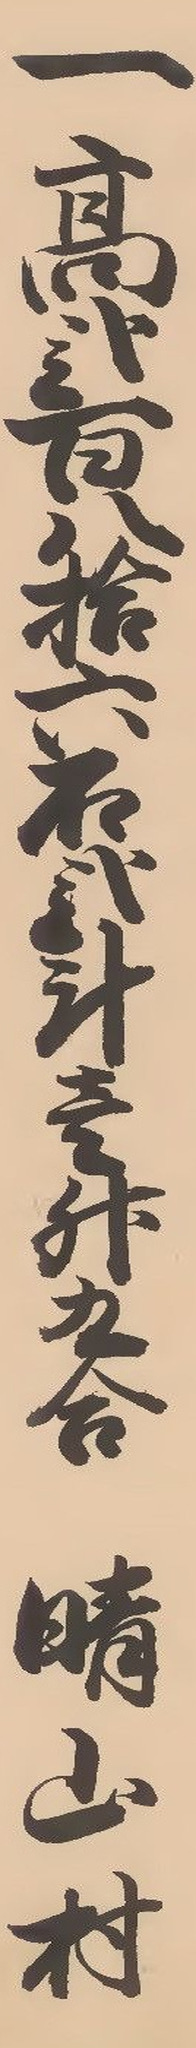一高弐百八拾六石弐斗壱升九合晴山村
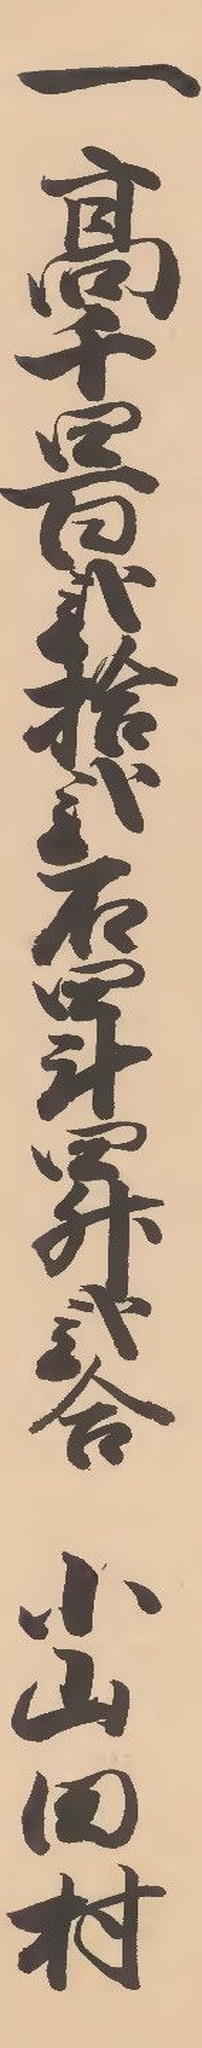一高千四百弐拾弐石四斗四升弐合小山田村
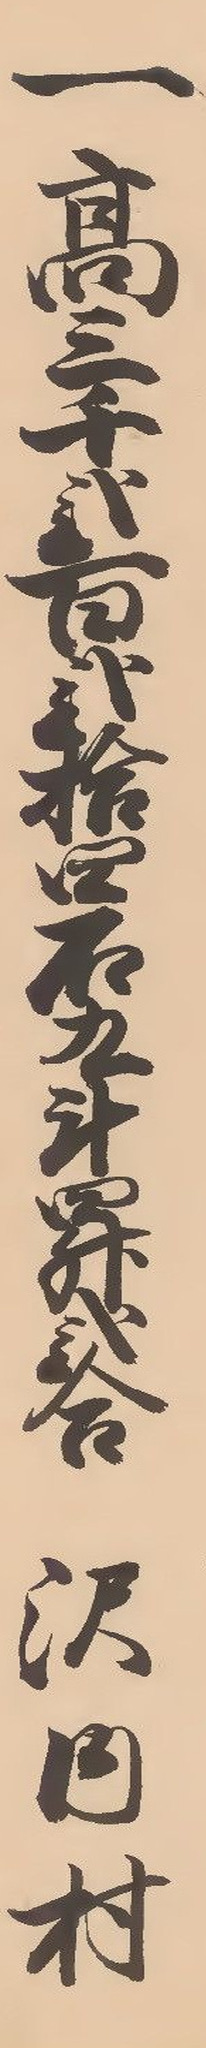一高三千弐百弐拾四石九斗四升弐合沢内村

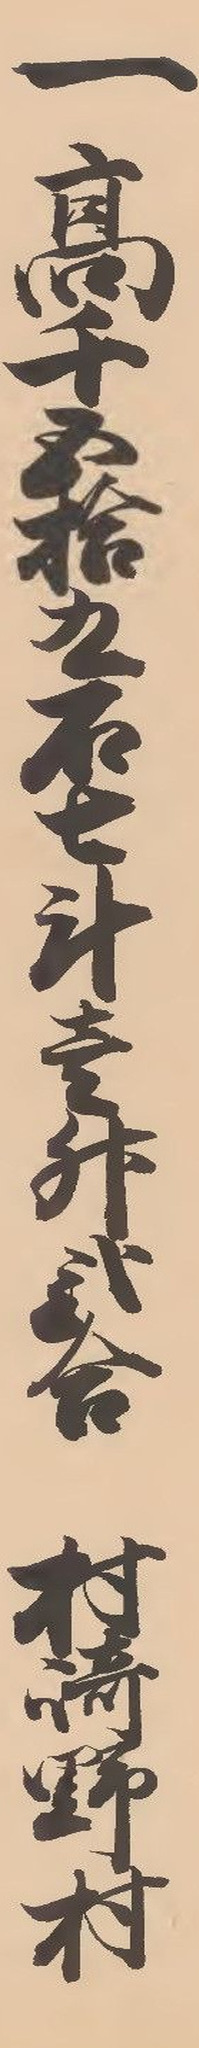一高千五拾九石七斗壱升弐合村崎野村
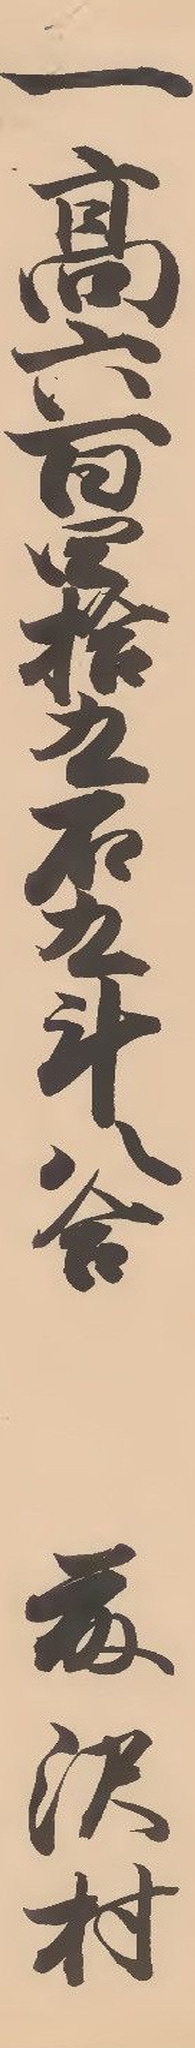一高六百四拾九石九斗八合藤沢村
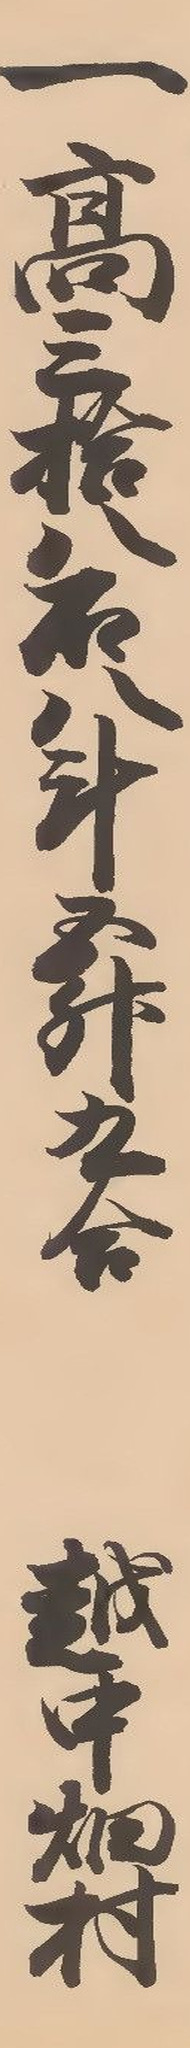一高三拾八石八斗五升九合越中畑村
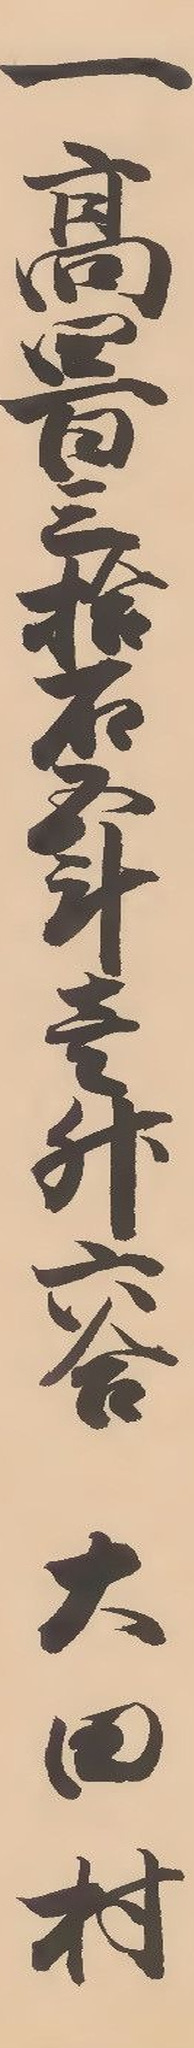一高四百三拾石五斗壱升六合大田村
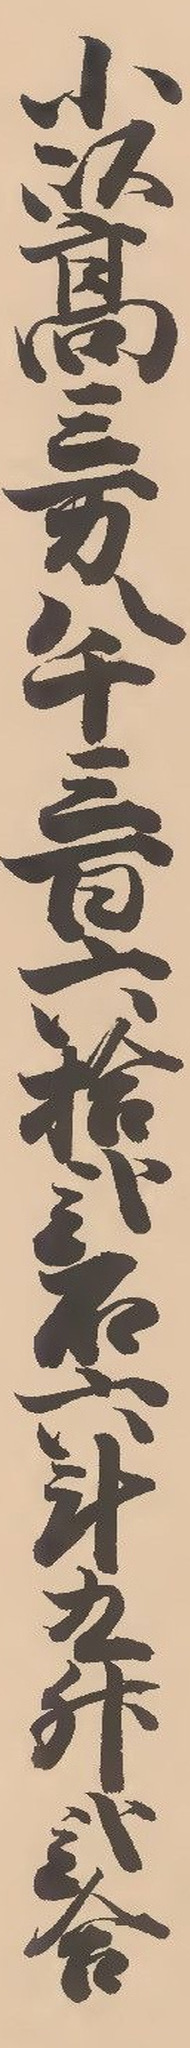小以高三万八千三百六拾弐石六斗九升弐合
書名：陸奥国郷帳　６
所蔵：国立公文書館 National Archives of Japan
